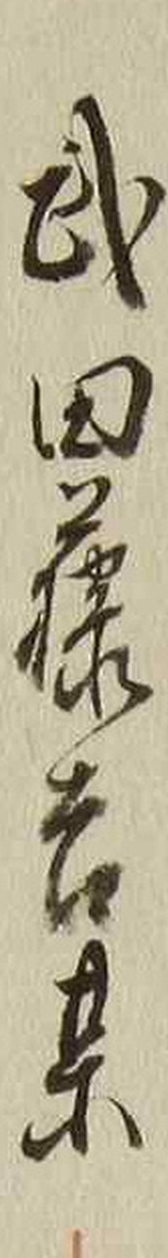武田藤吉某
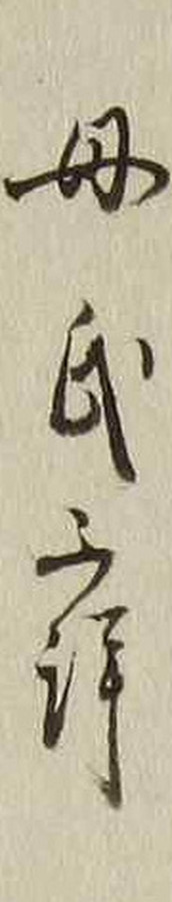母氏不詳
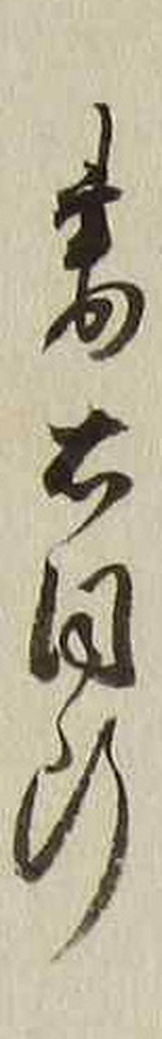妻右同断
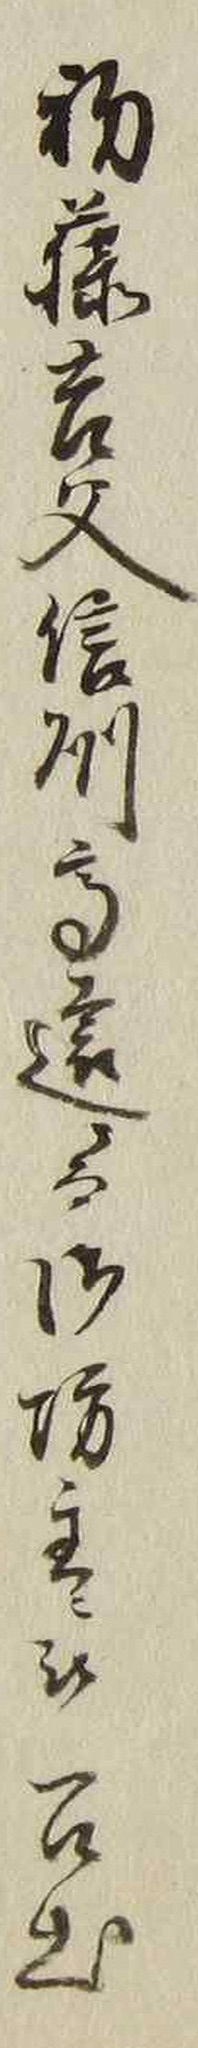初藤吉父信州高遠ニ而御坊主ニ被召出
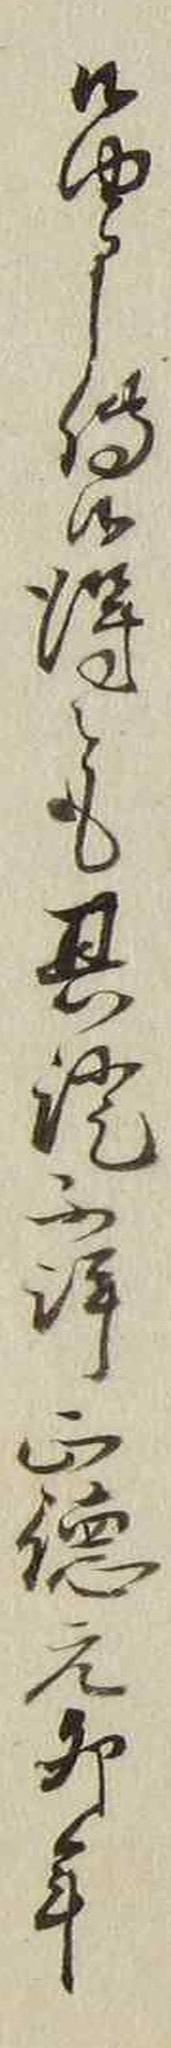候由申伝候得とも其証不拝正徳元卯年
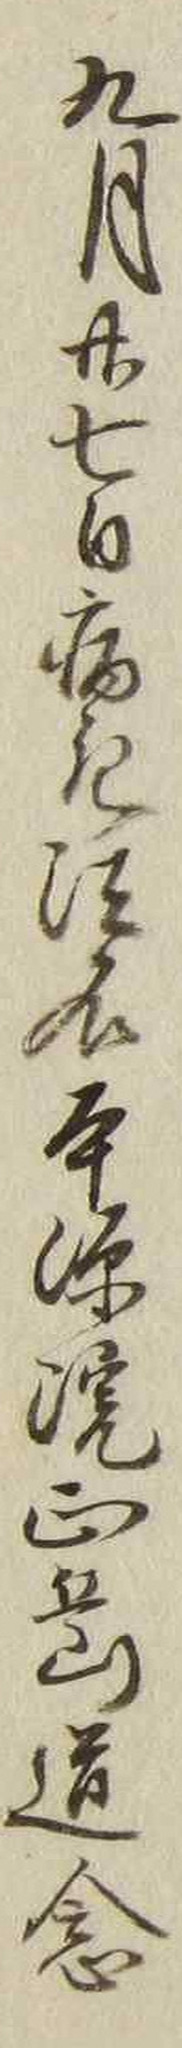九月廿七日病死法名本源院正岳道念

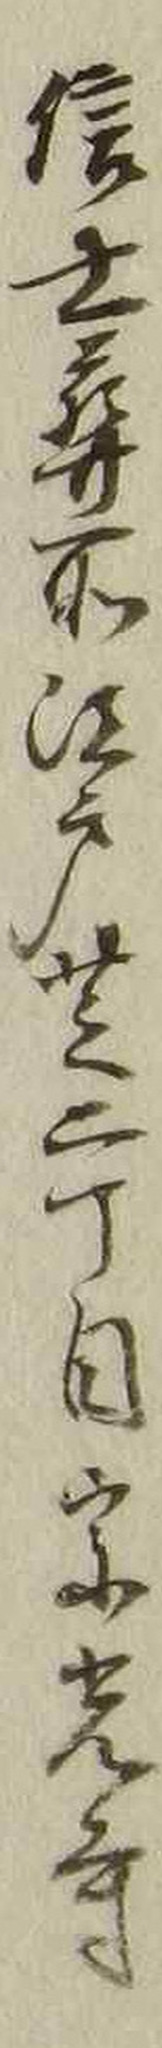信士葬所江戸芝二丁自宗光寺
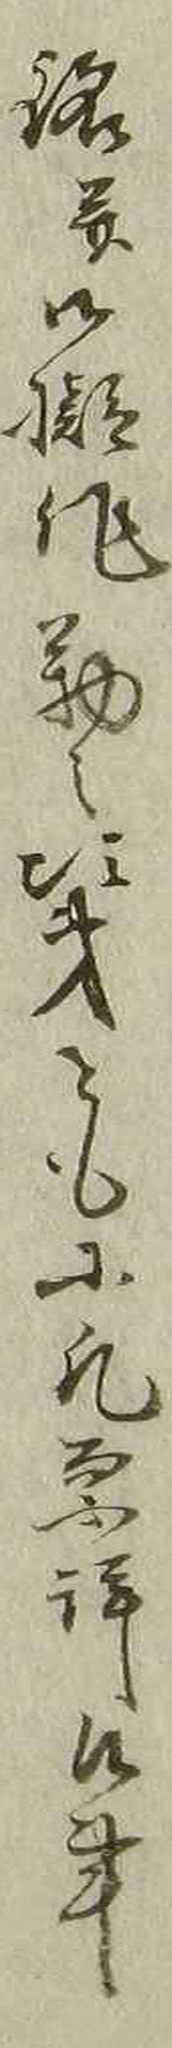銘并御擬作勤之次第ともに凡而不詳候事
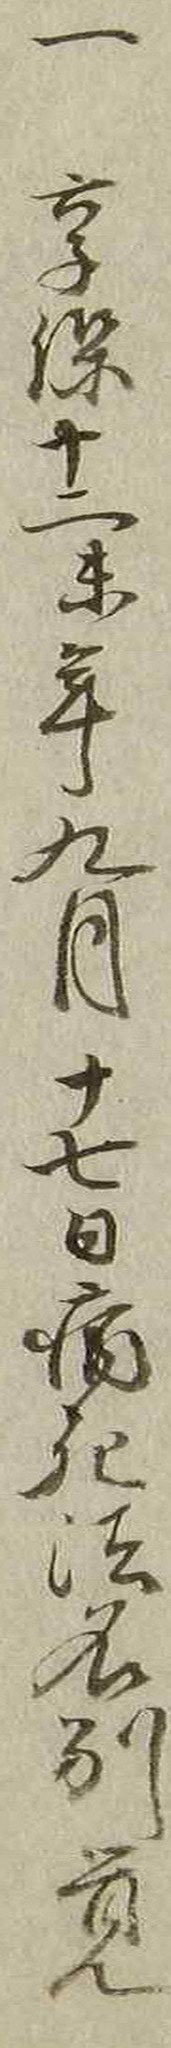一享保十二未年九月十七日病死法名別覚
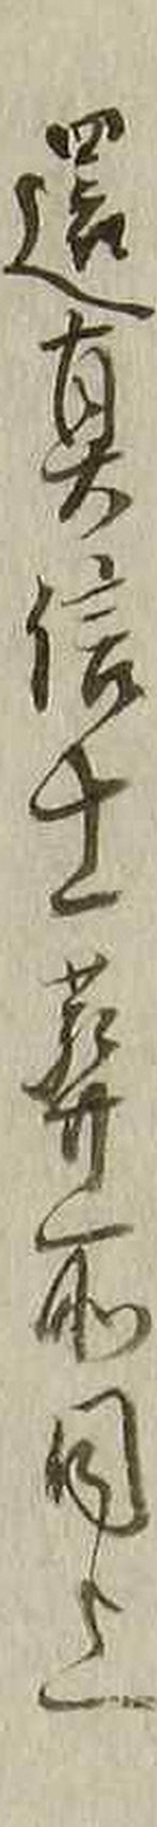還真信士葬所同上
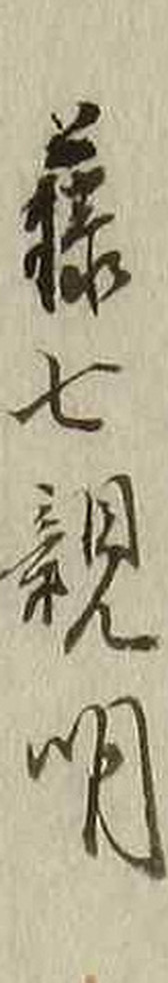藤七親明
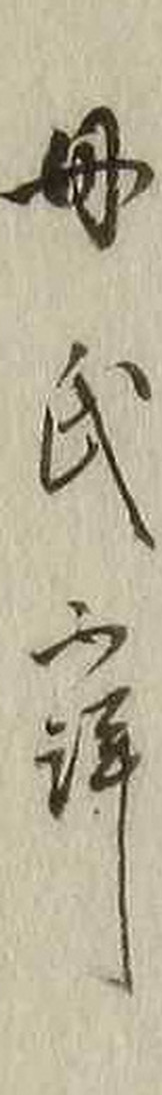母氏不詳
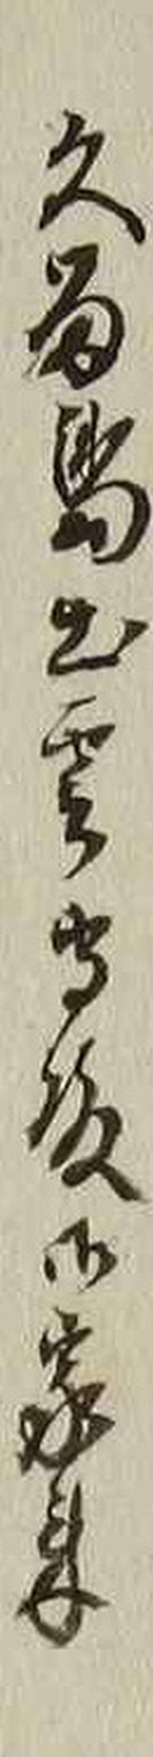久留島出雲守殿御家来
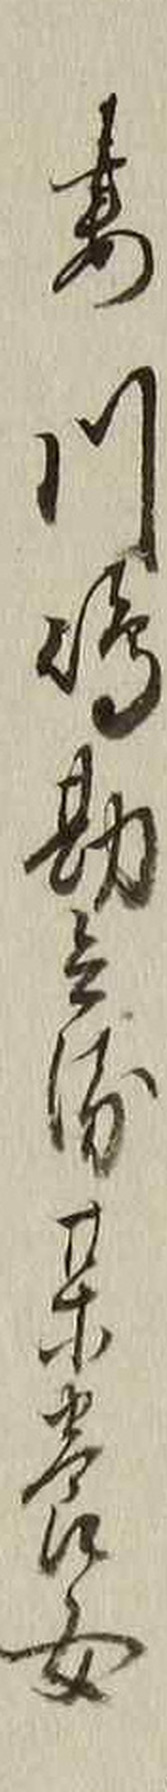妻川島勘兵衛某養女
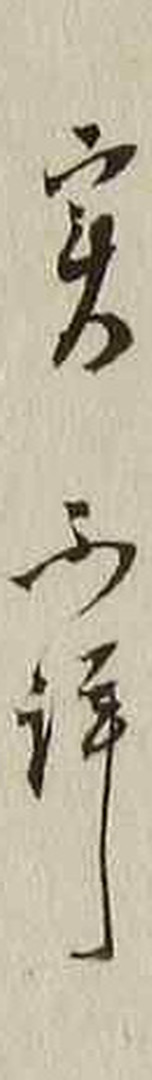実不詳
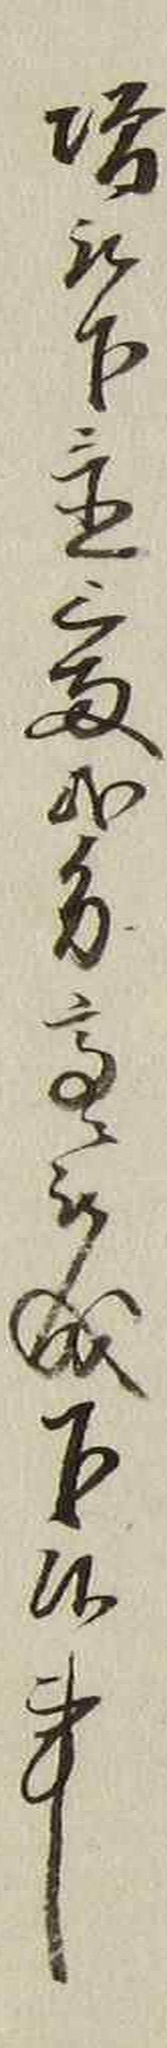増被下置三両弐分高ニ被成下候事
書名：諸士系譜　巻之132　た之部8
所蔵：会津若松市立会津図書館
